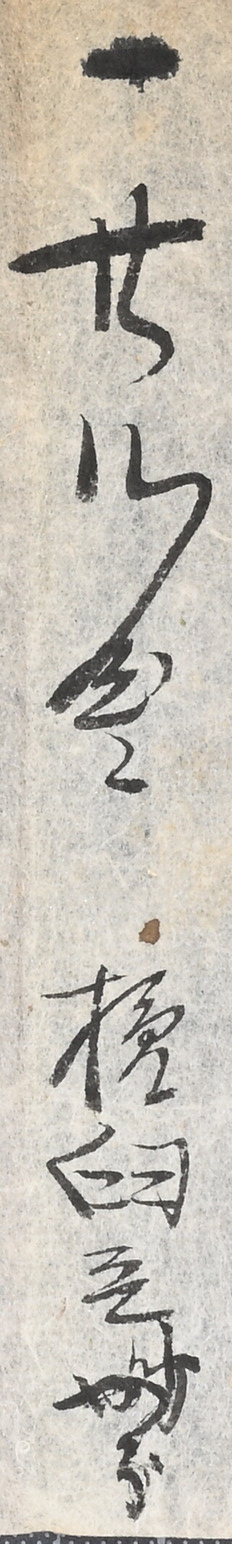一、廿八匁挽臼分
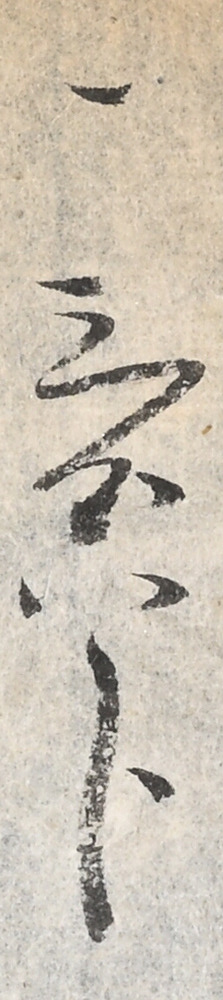廿三匁五分
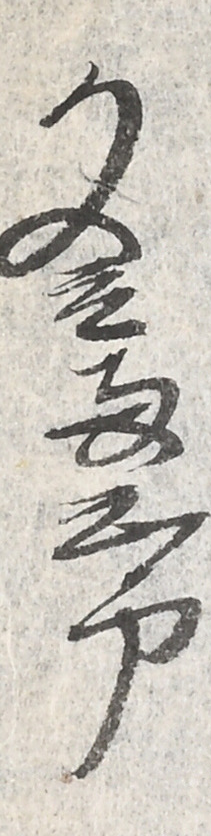久三両三郎
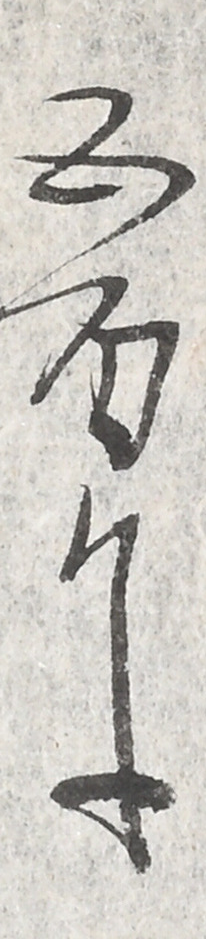五百分
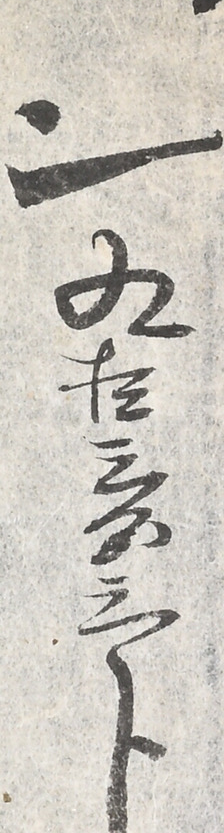二九拾三匁三分
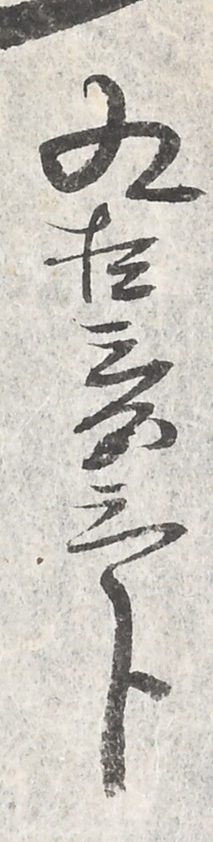二九拾三匁三分
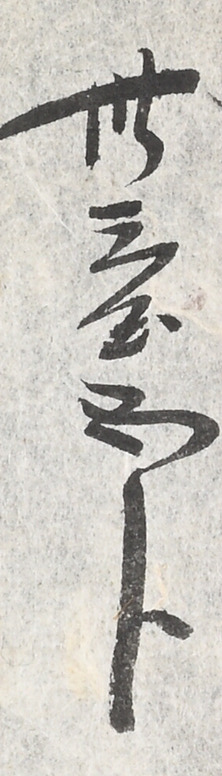廿三匁五分
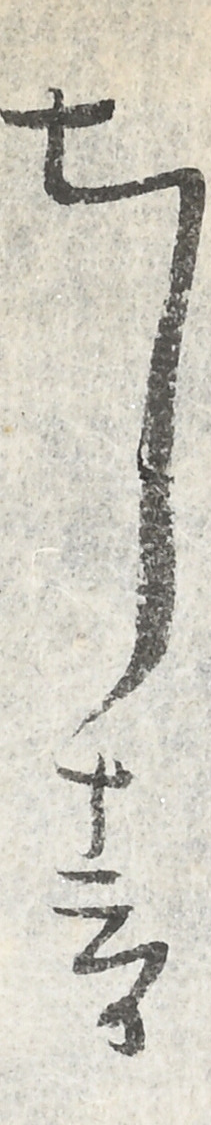十月十三日
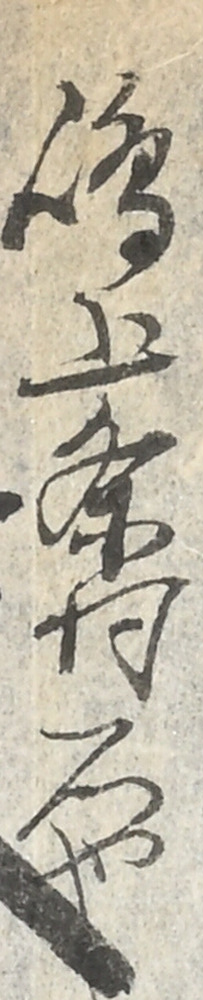嶋上条村右也
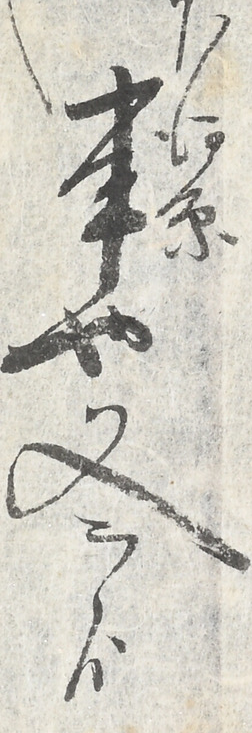庄や又二郎
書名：覚
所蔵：伊那市立高遠町図書館・合同会社AMANE
